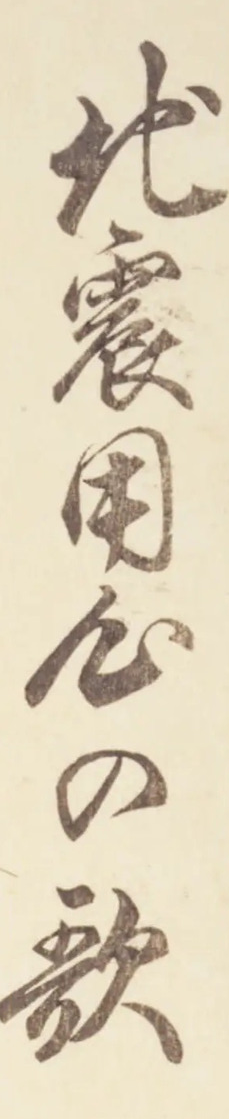地震用心の歌
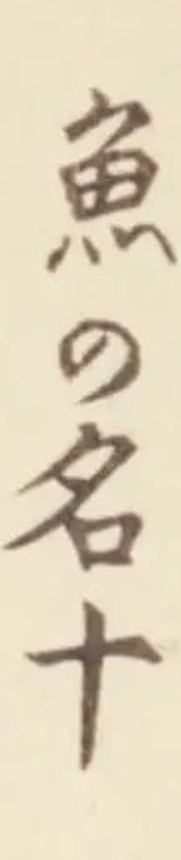魚の名十
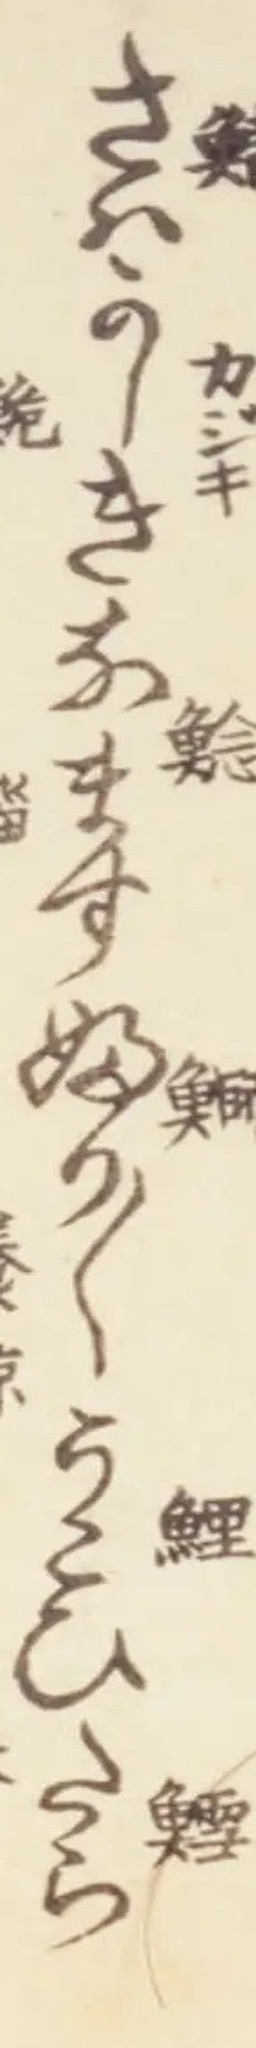さはかしきなますふり〳〵うこいたら
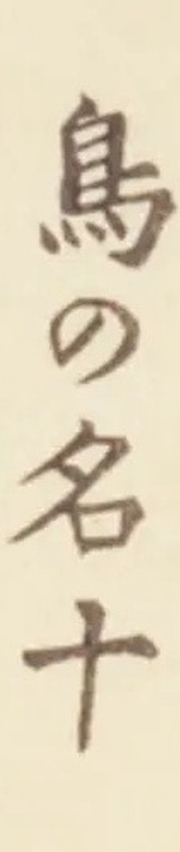鳥の名十
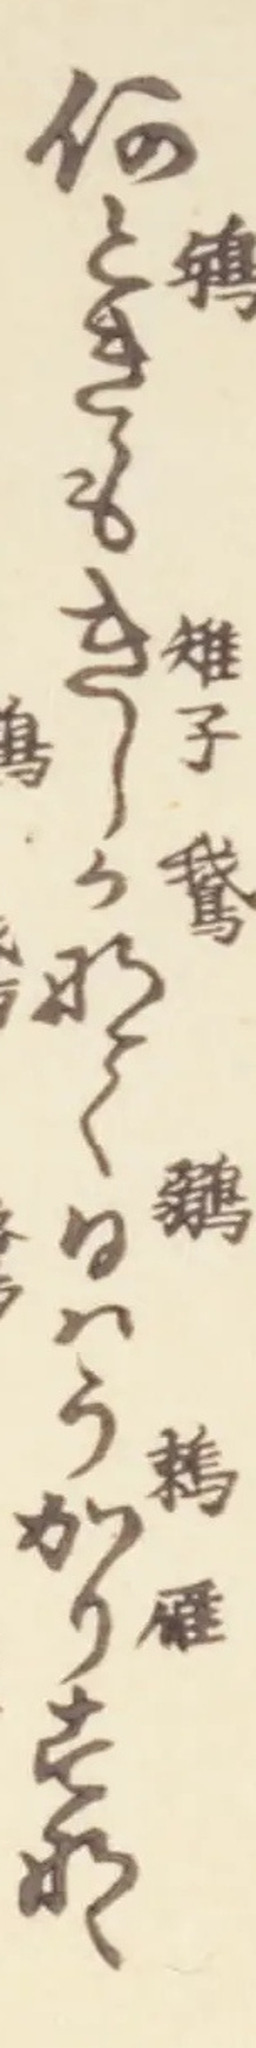何ときもきしかなく日はうかりすな
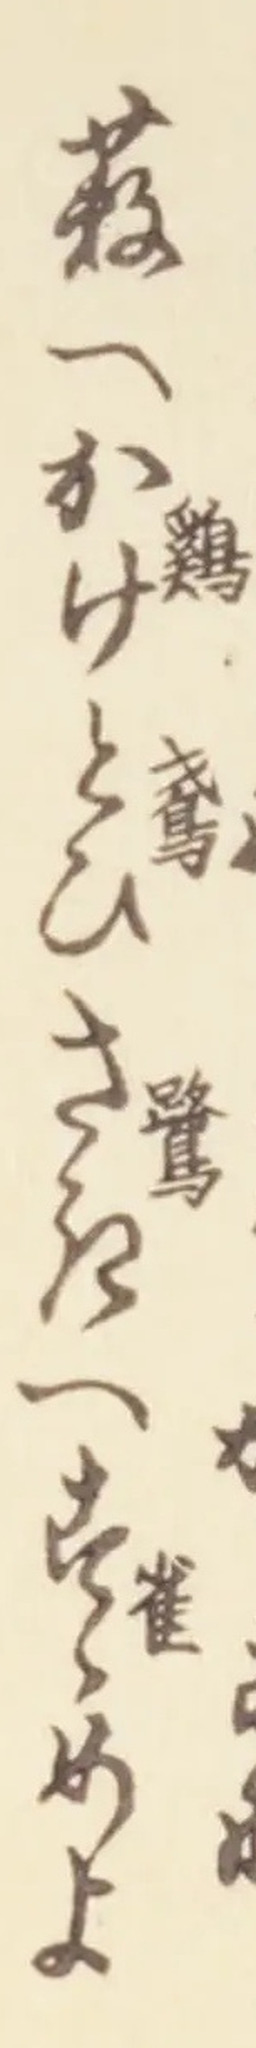藪へかけとひさきへすすめよ
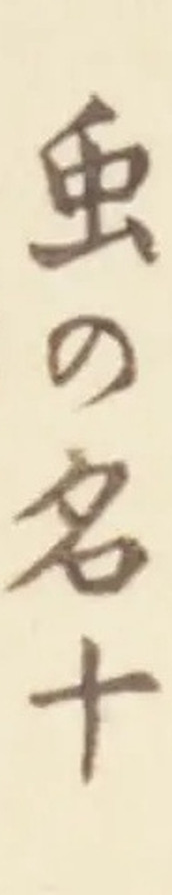虫の名十
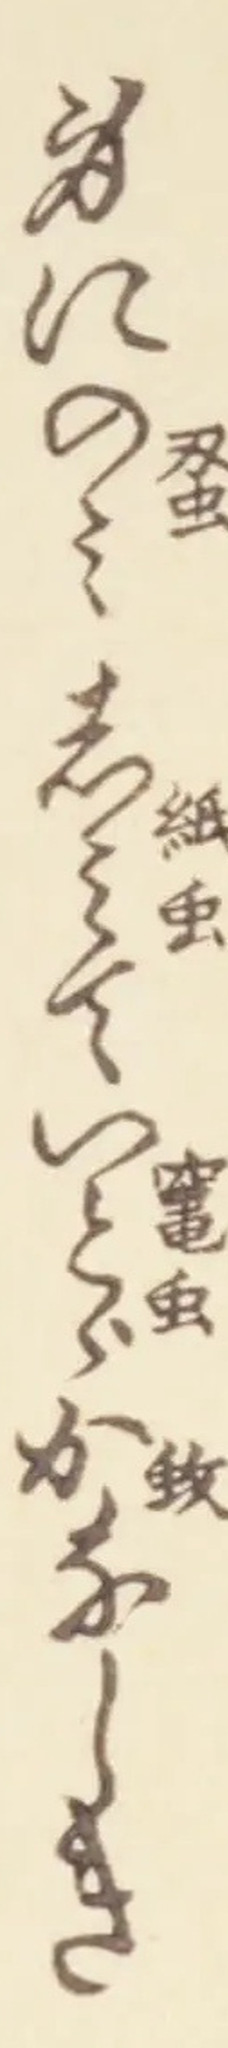身にのみしみていとどかなしき
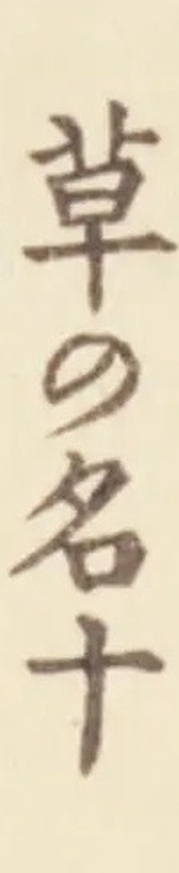草の名十
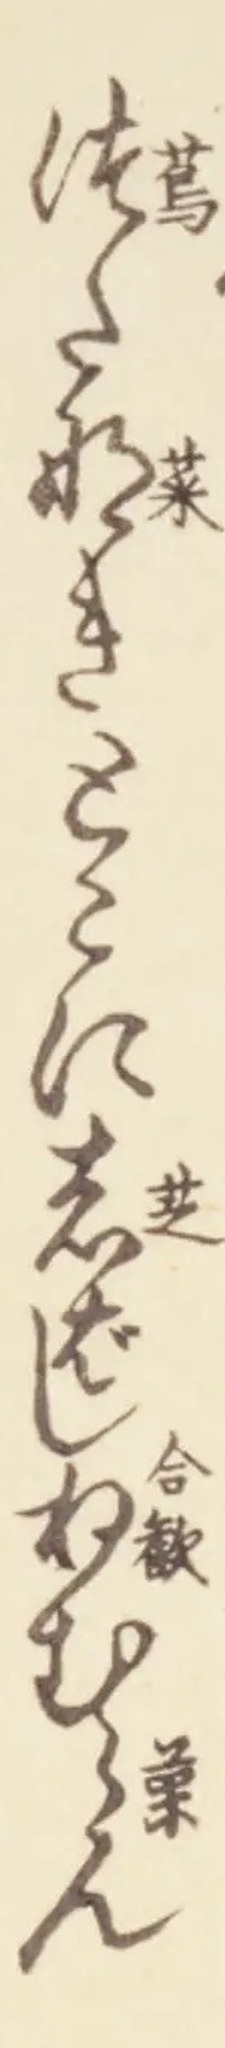つたなきとこにしばしねむらん
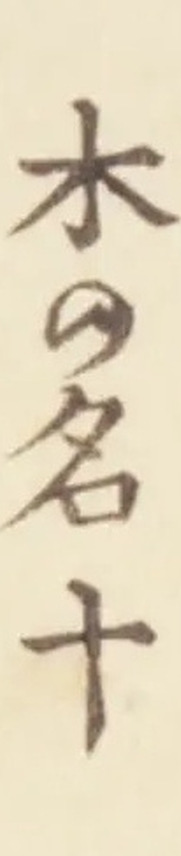木の名十
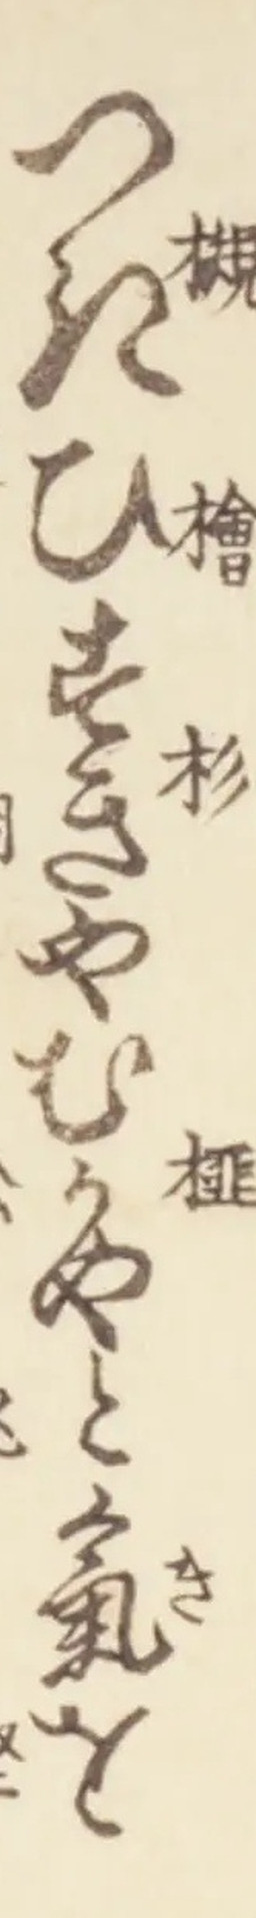つきひすきやむかやと気を
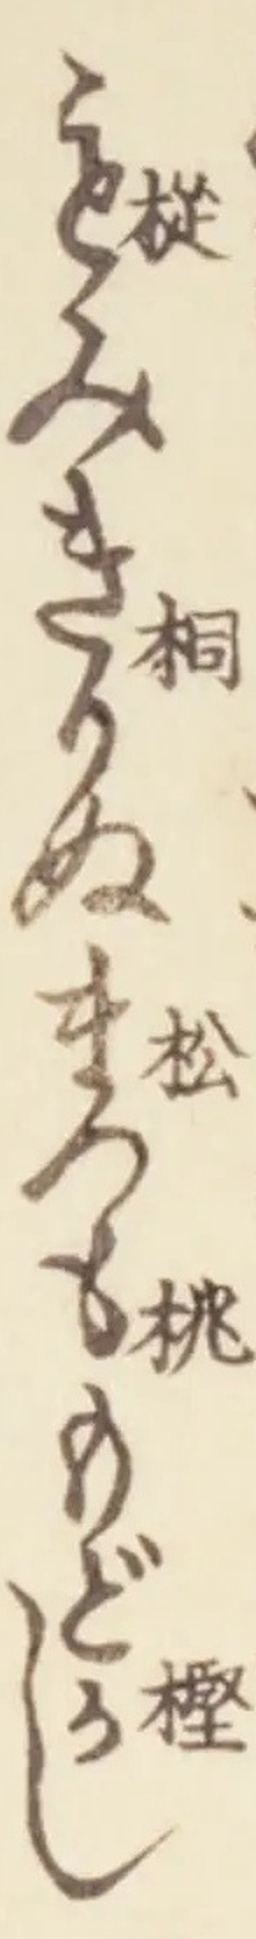もみきりぬまつももどかし
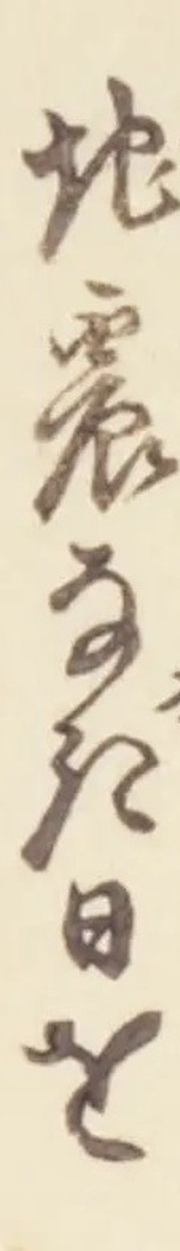地震なき日を
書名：地震用心の歌
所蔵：国立国会図書館 National Diet Library, JAPAN
